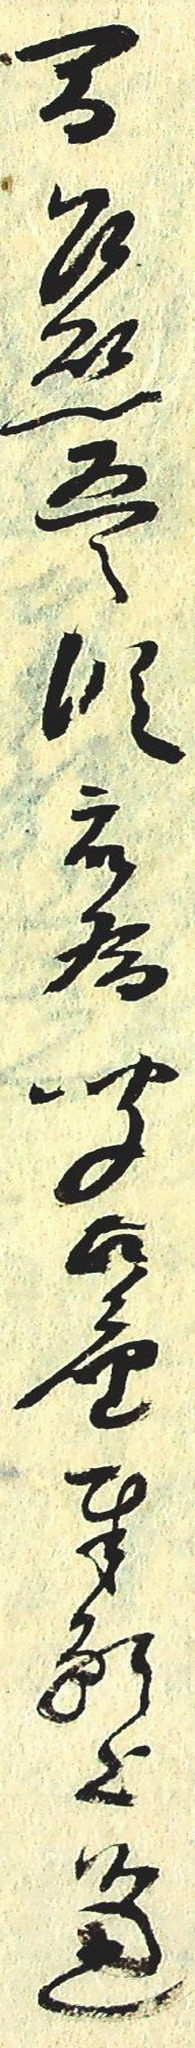間乍恐右之段被為聞召届奉願上候通
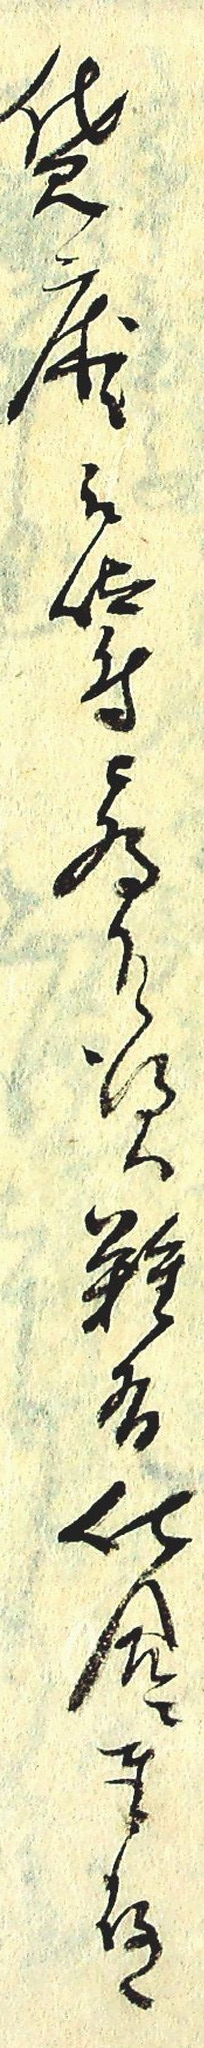貸床に被仰付被為下候得は難有仕合に奉存候
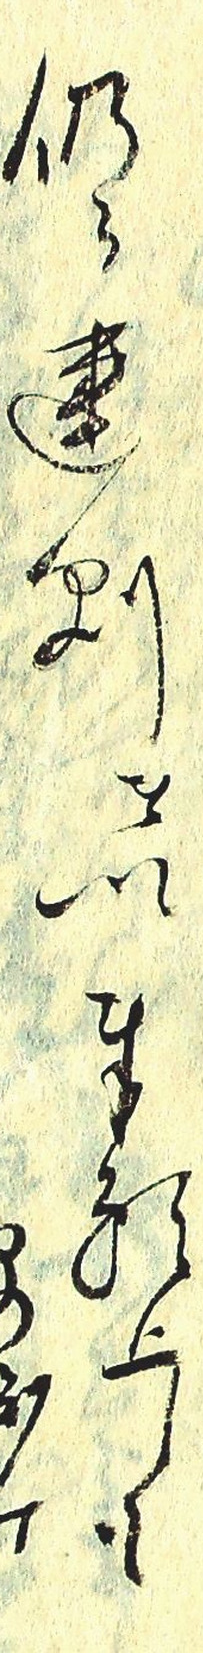仍て連判を以奉願上候以上
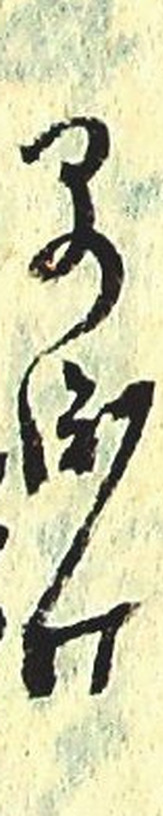早淵村
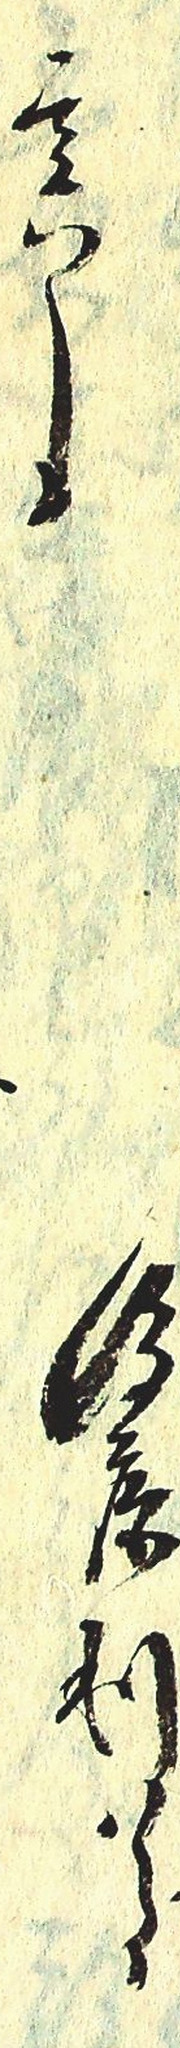亥八月後藤利八郎
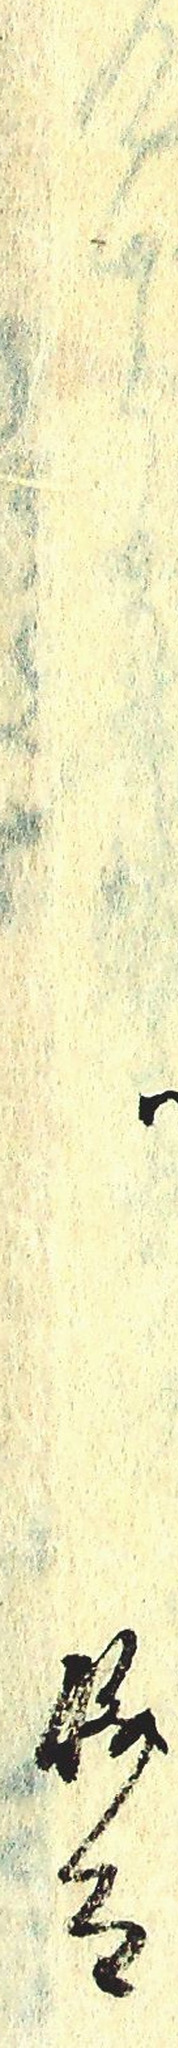同磯太

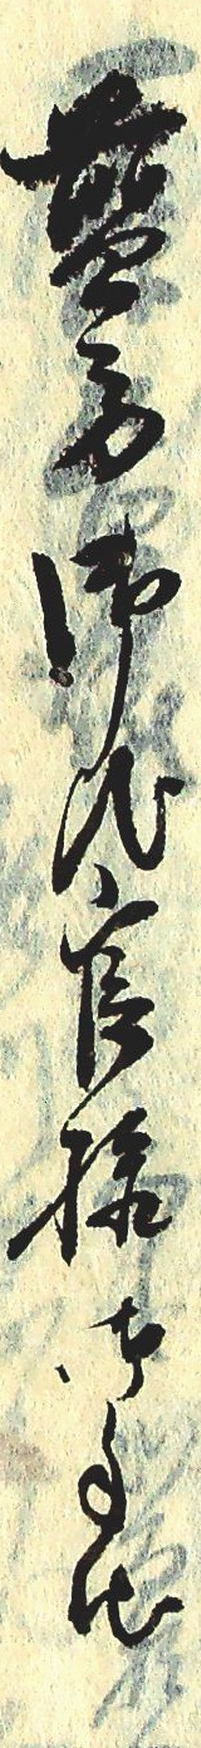藍方御代官様御手代
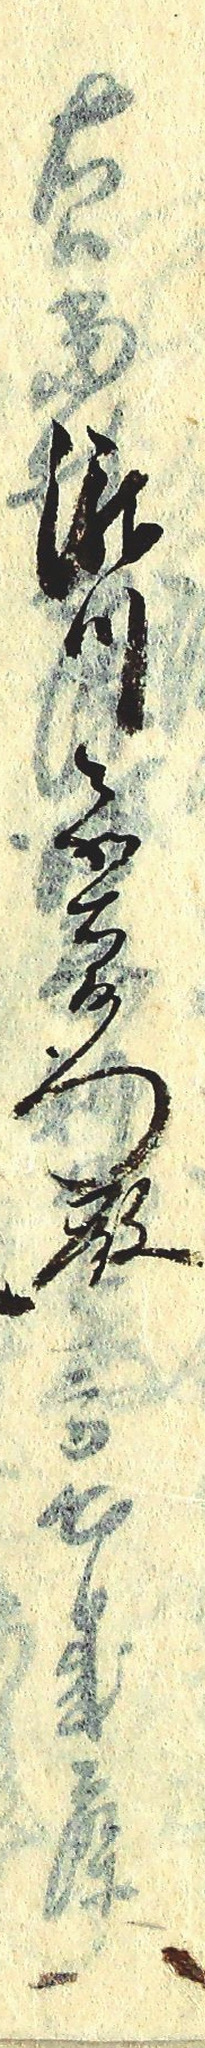瀧川嘉右衛門殿
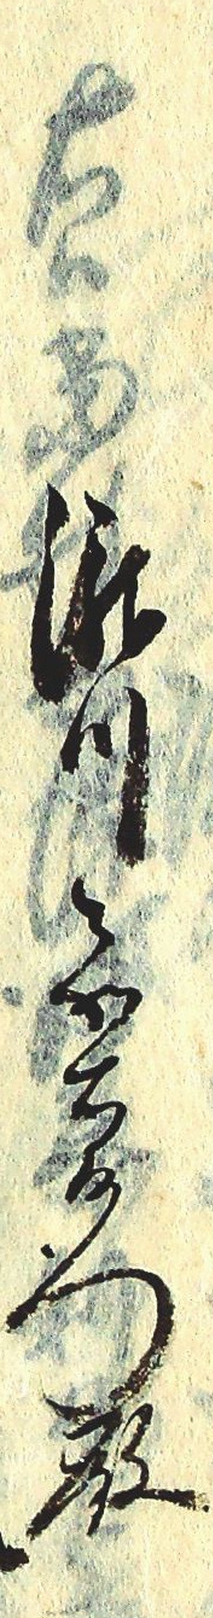瀧川嘉右衛門殿
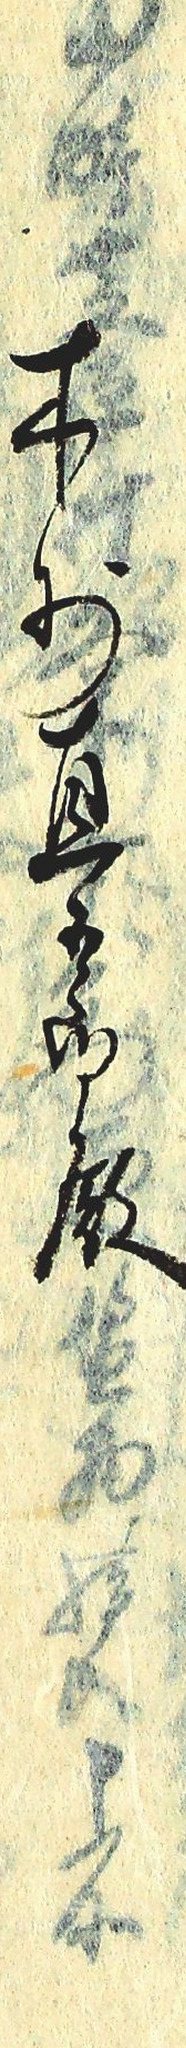木村直五郎殿
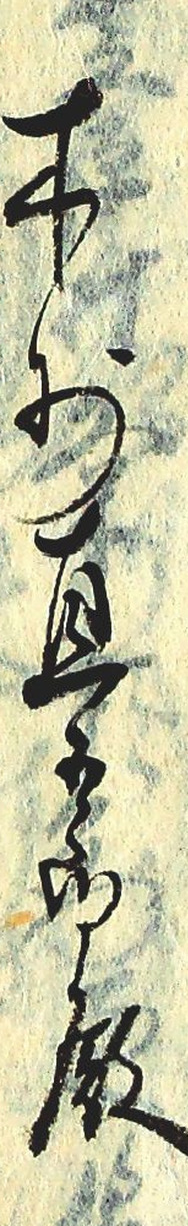木村直五郎殿
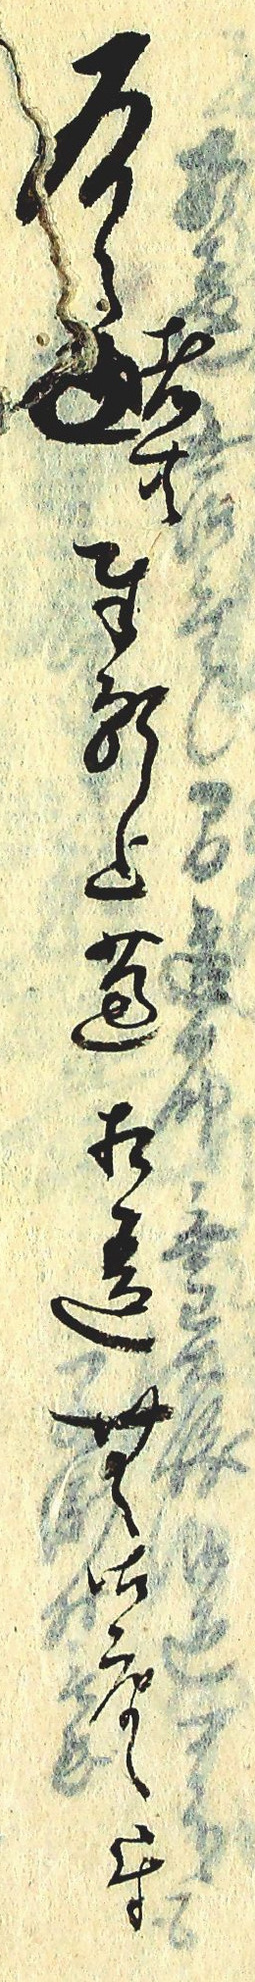右之者共奉願上通相違無御座候に付
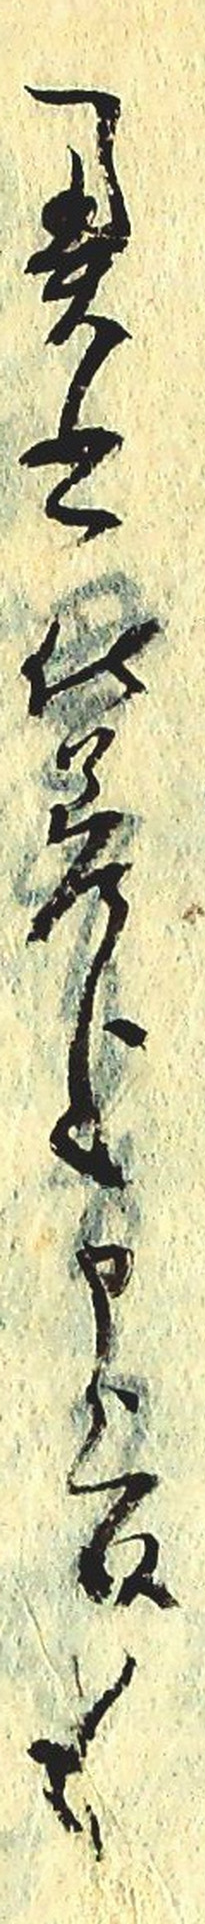奥書仕差上申上候以上
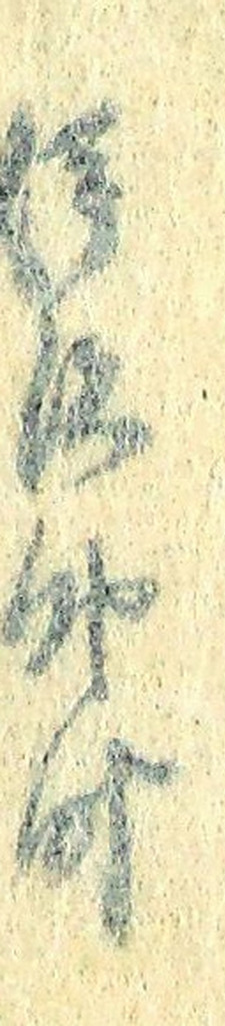伊沢仲助
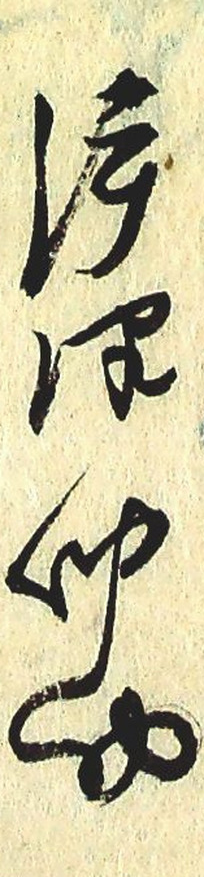伊沢仲助
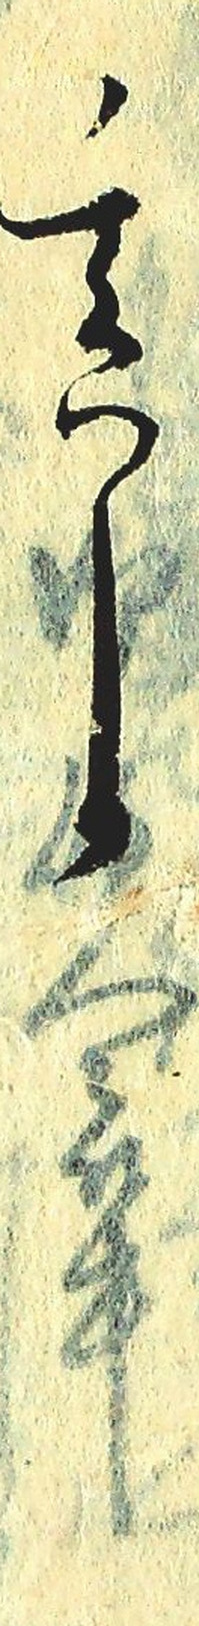亥八月
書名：諸御願書控(弐番）
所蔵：鳴門教育大学 Naruto University of Education
